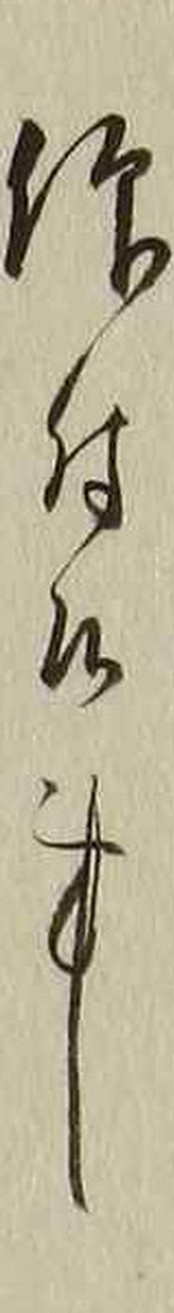仰付候事
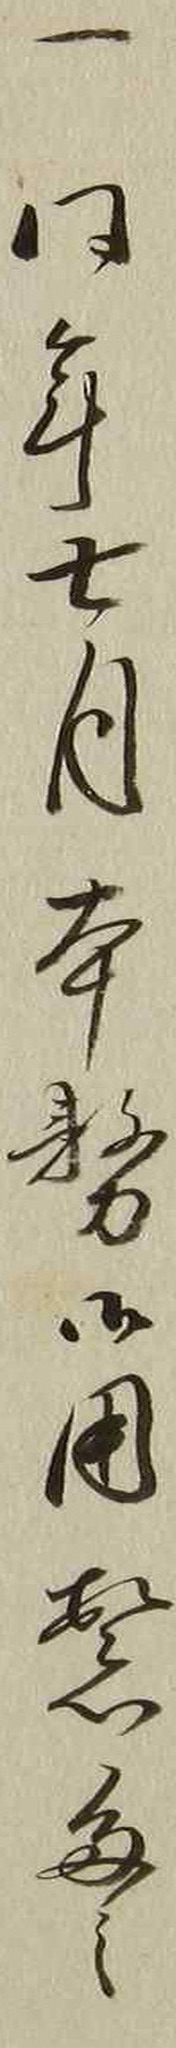一同年七月本務御用繁多之
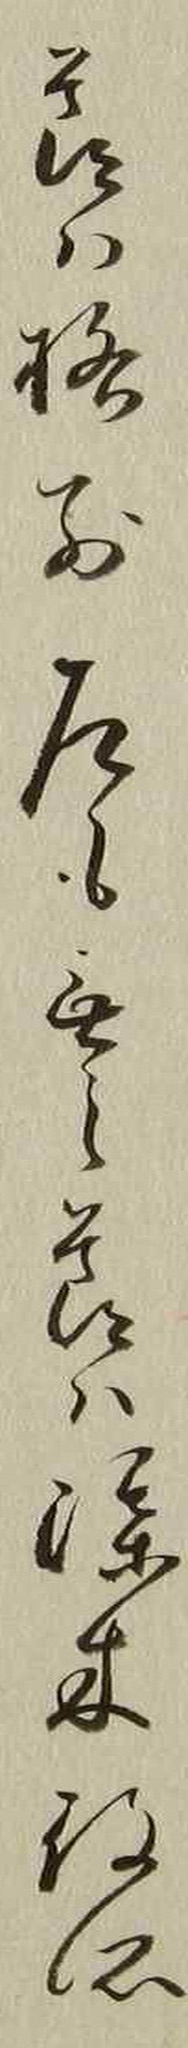節ハ格別乍も無之節ハ漆木役所
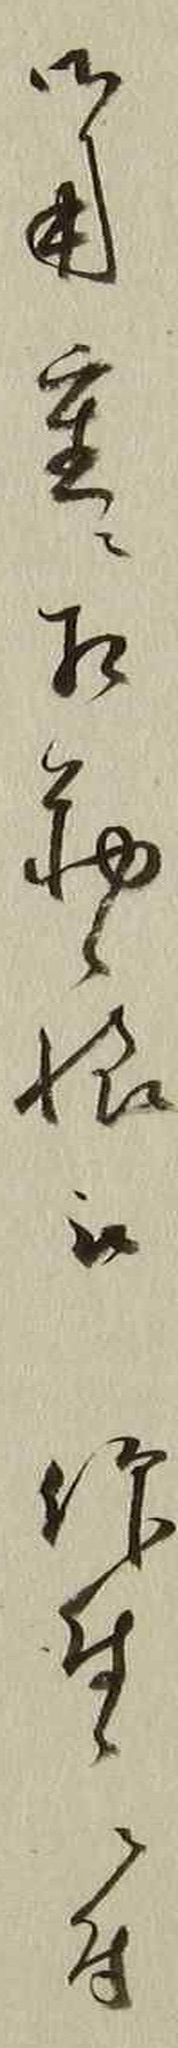御用重ニ相勤候様被仰付候ニ付
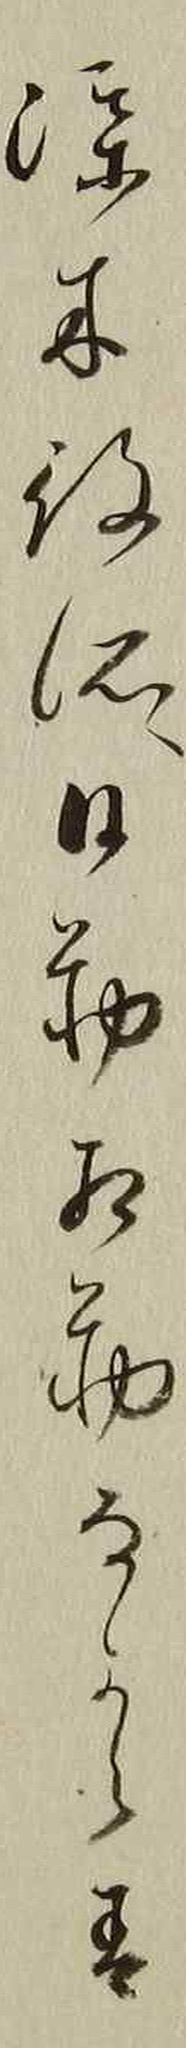漆木役所へ日勤相勤なから青
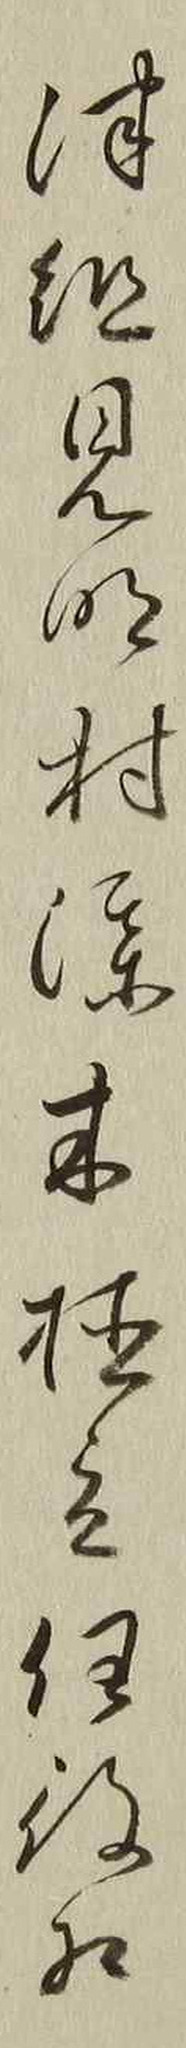津組見明村漆木植立任役相
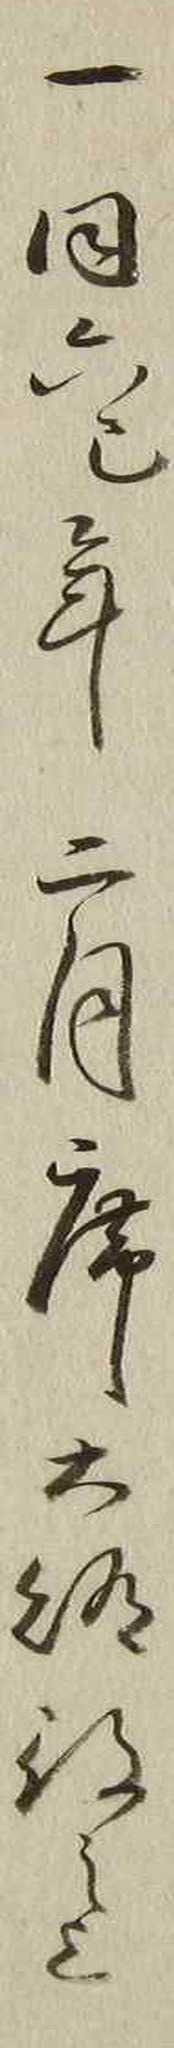一同六巳年二月席大賄役之上
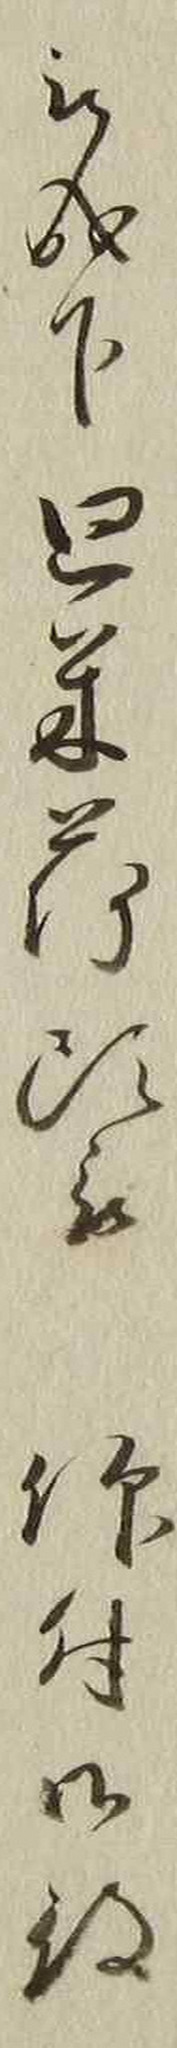被成下廻米荷頭被仰付御役
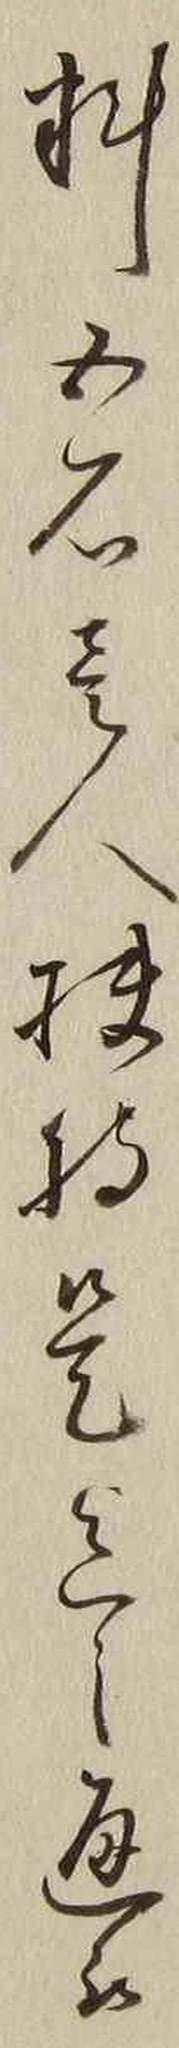料五石壱人扶持是迄之通被
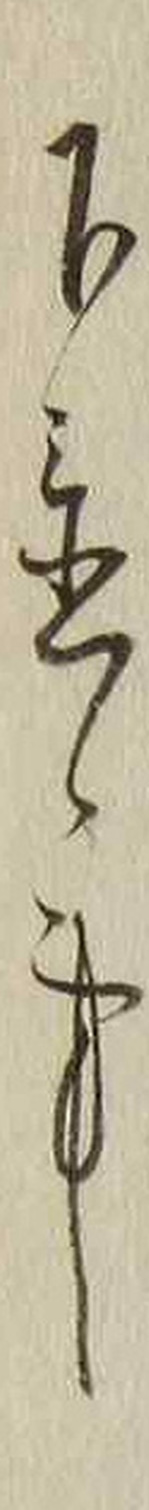下置候事
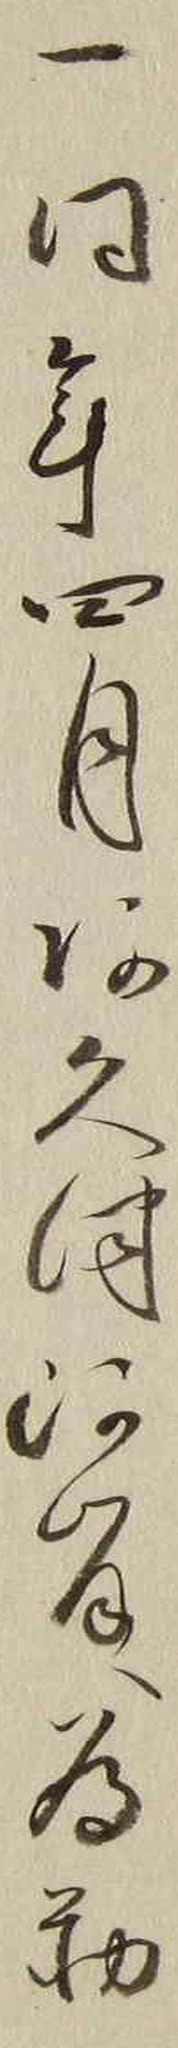一同年四月阿久津河岸へ為勤
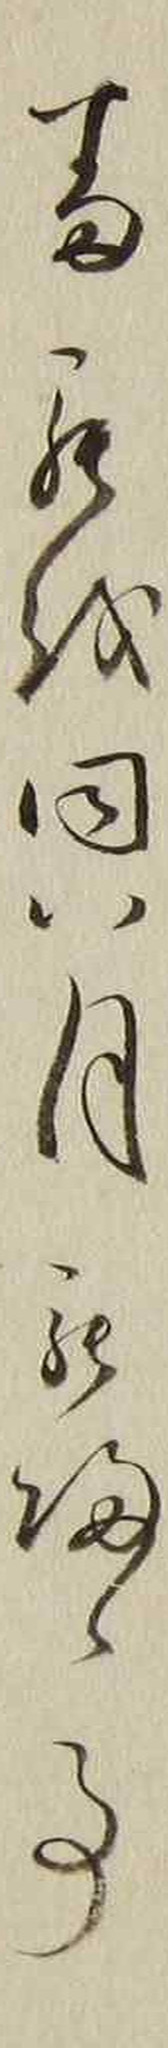番罷越同八月罷帰候事
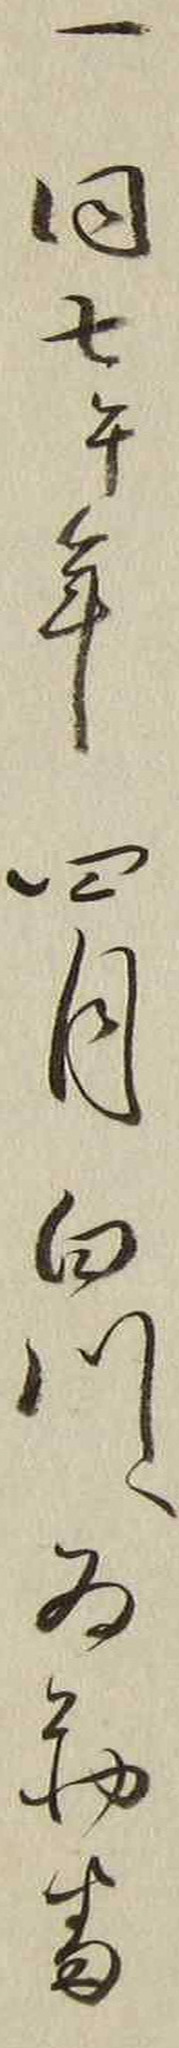一同七午年四月白川へ為勤番
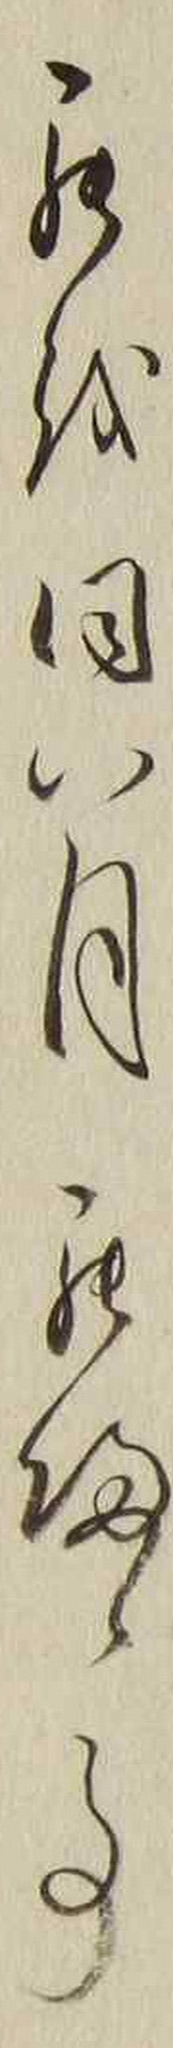罷越同八月罷帰候事

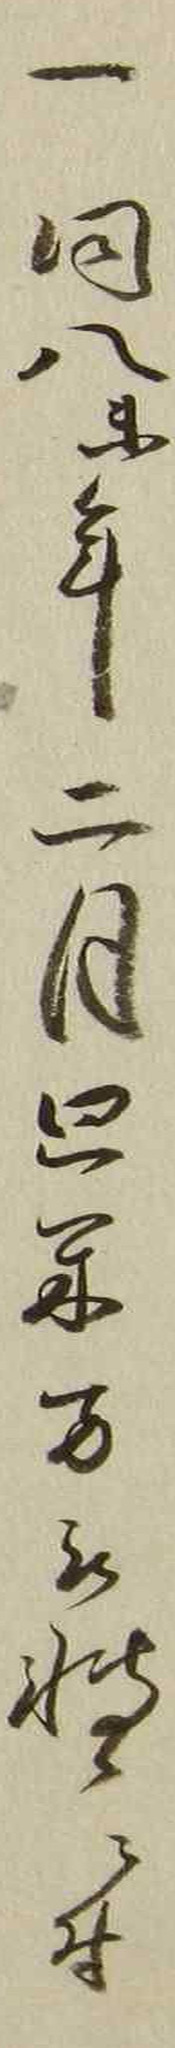一同八未年二月廻米方被転候ニ付
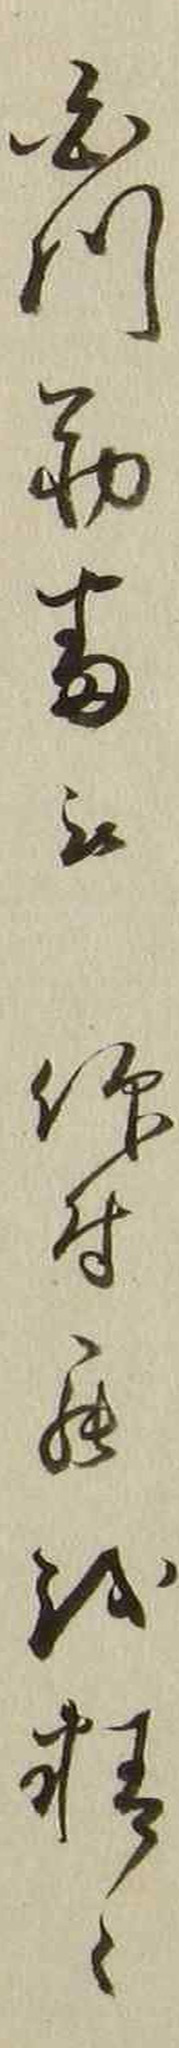白川勤番被仰付罷越精々
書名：諸士系譜　巻之52　に之部3
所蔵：会津若松市立会津図書館
